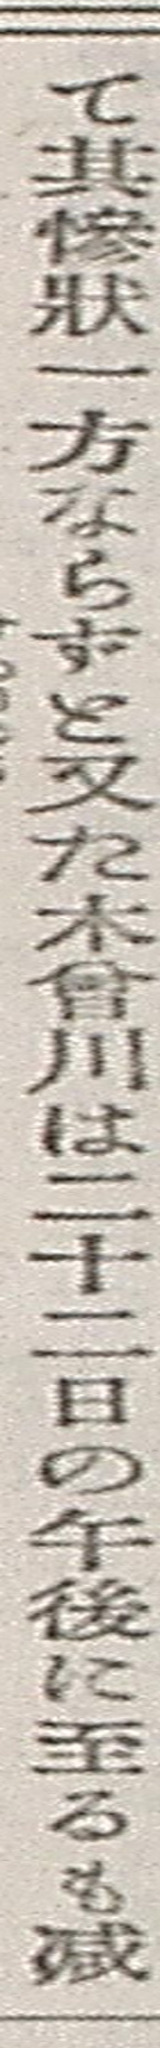て其惨状一方ならずと又た木曽川は二十二日の午後に至るも減
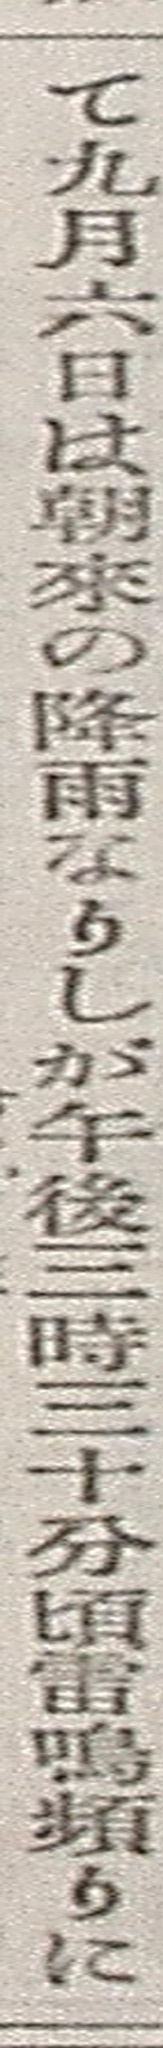て九月六日は朝來の降雨なりしが午後五時三十分頃雷鳴頻りに
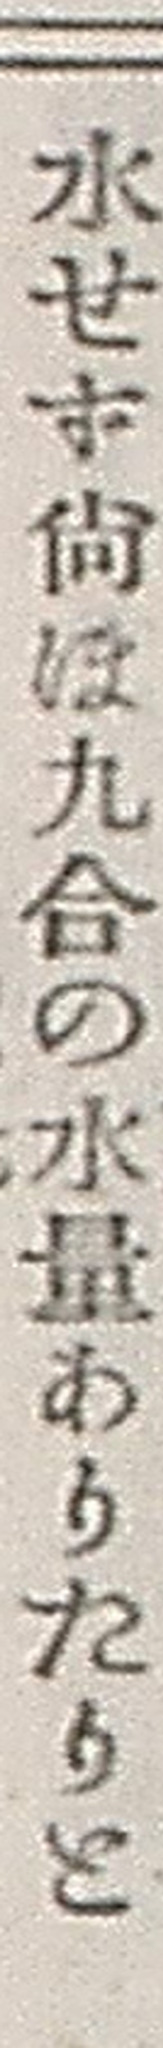水せず尚ほ九合の水量ありたりと
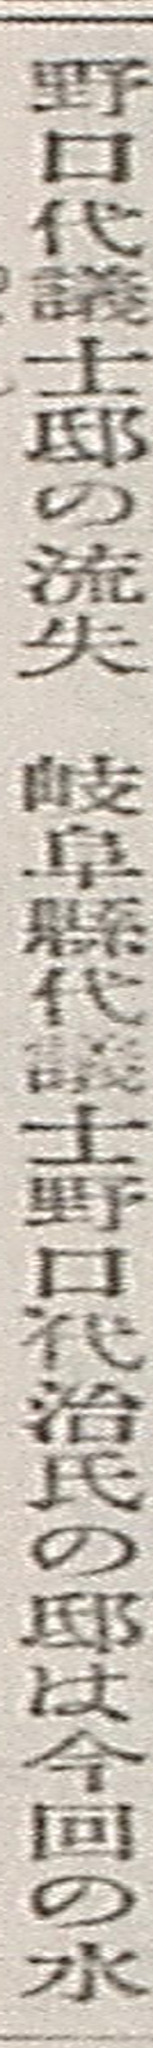野口代議士邸の流失岐阜縣代議士野口代治氏の邸は今回の水
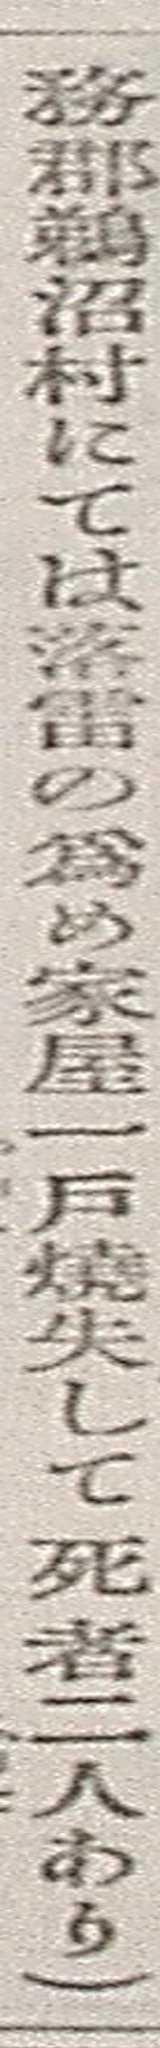務郡鵜沼村にては落雷の為め家屋一戸焼失して死者二人あり）
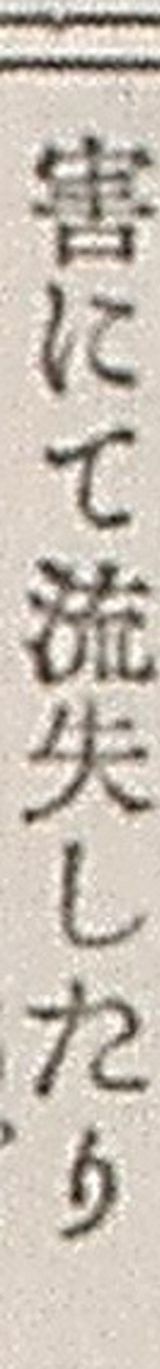害にて流失したり
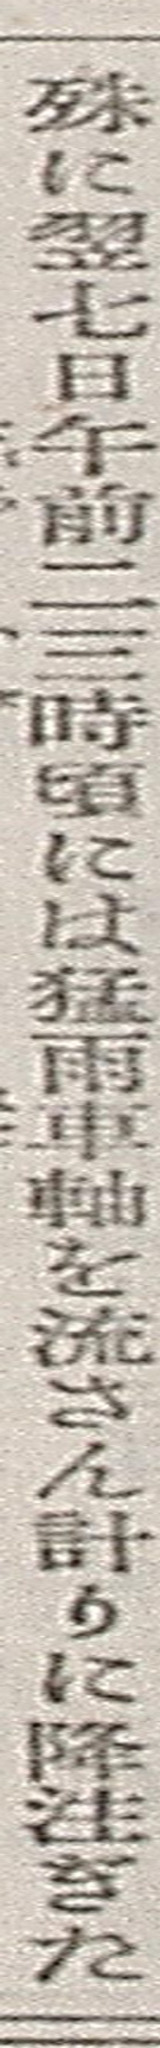殊に翌七日午前二三時頃には猛雨車軸を流さん計りに降注ぎた
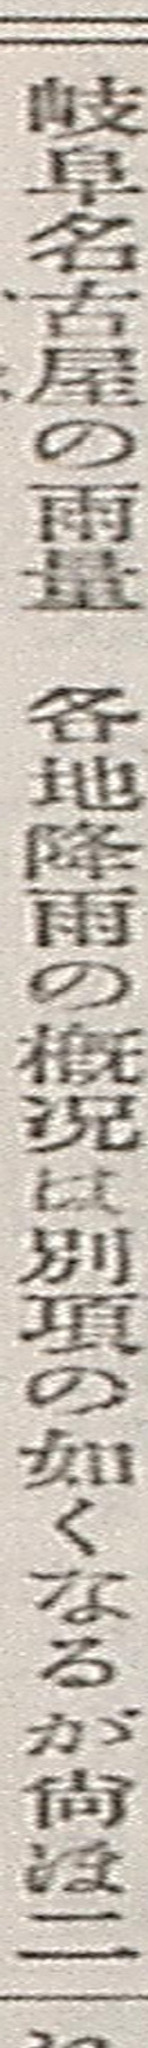岐阜名古屋の雨量各地降雨の概況は別項の如くなるが尚ほ二
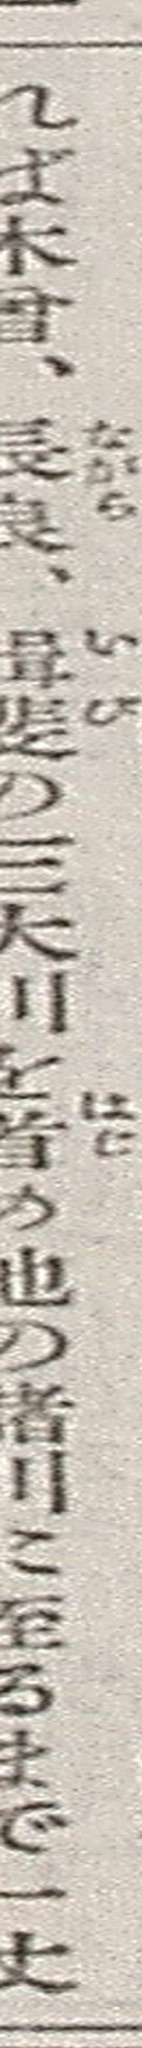れば木曽、長良、揖斐の三大川を首め他の諸川に至る迄一丈
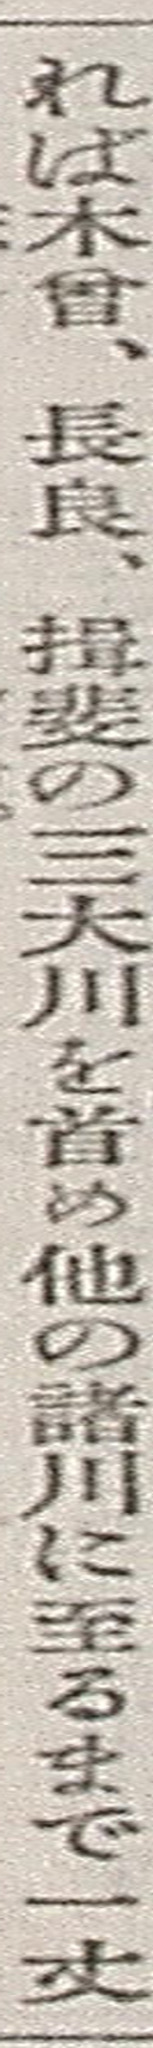れば木曽、長良、揖斐の三大川を首め他の諸川に至る迄一丈
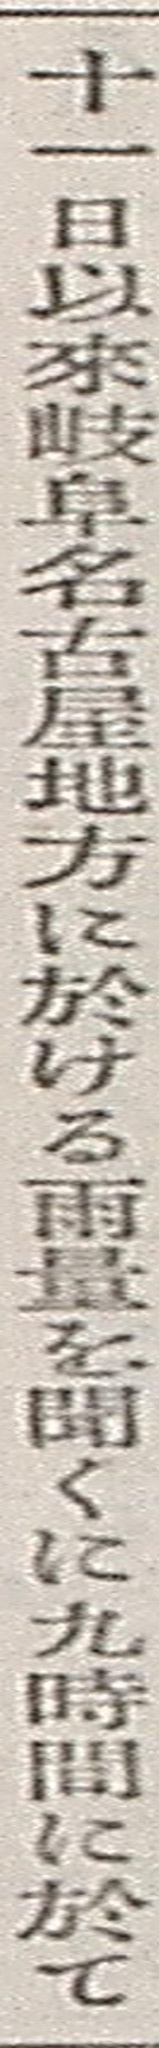十一日以来岐阜名古屋地方に於ける雨量を聞くに九時間に於て
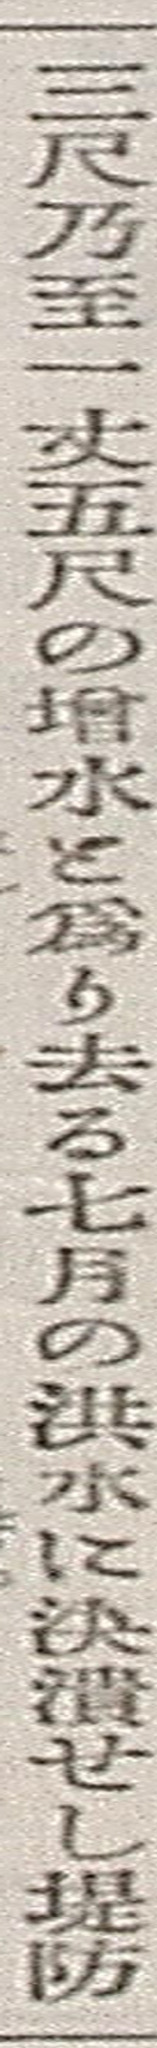三尺乃至一丈五尺の増水と為り去る七月の洪水に决崩せし堤
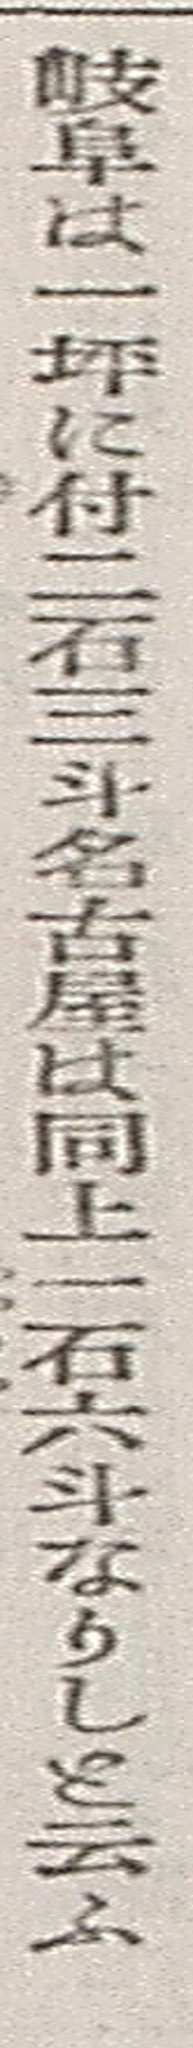岐阜は一坪に付二石三斗名古屋は同上一石六斗なりしと云ふ
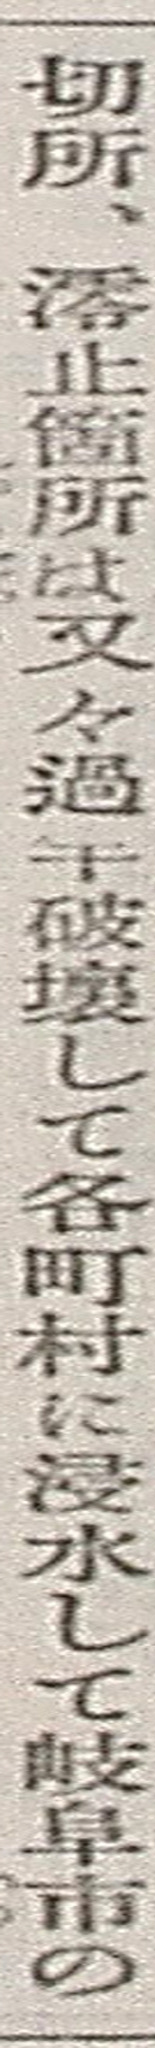切所、澪止箇所は又々過半破壊して各町村に浸水して岐阜市
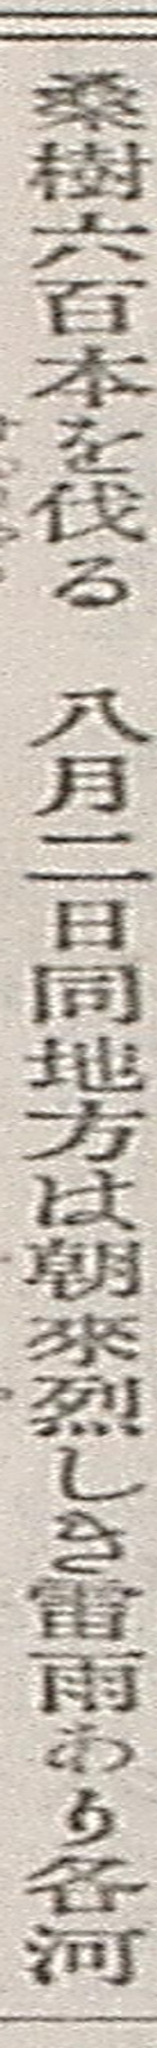桑木六百本を伐る八月二日同地方は朝來烈しき雷雨あり各河
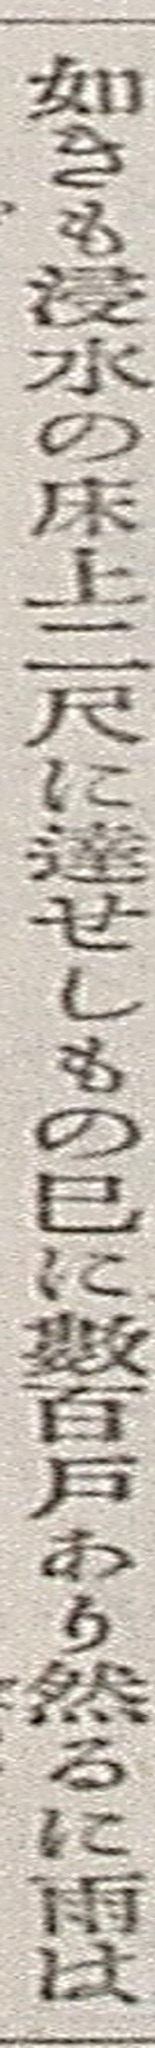如きも浸水の床上二尺に達せしもの已に数百戸あり然るに雨は
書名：風俗畫報臨時増刊第百二十六號　洪水被害録（中）
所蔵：東京大学地震研究所図書室 Earthquake Research Institute Library, The University of Tokyo, JAPAN
